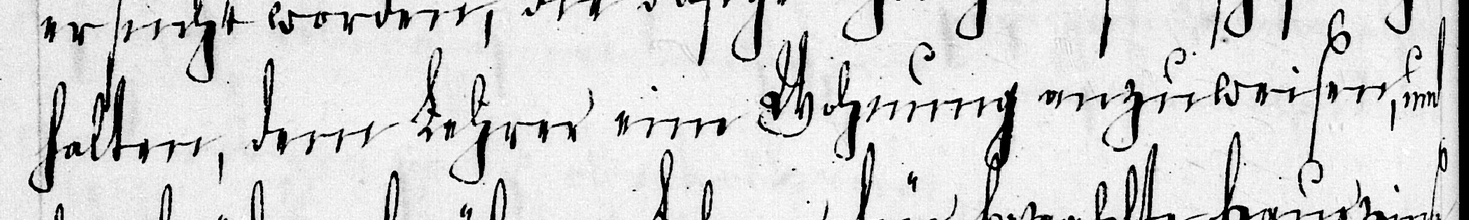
halten, dem Lehrer eine Wohnung anzuweisen, und
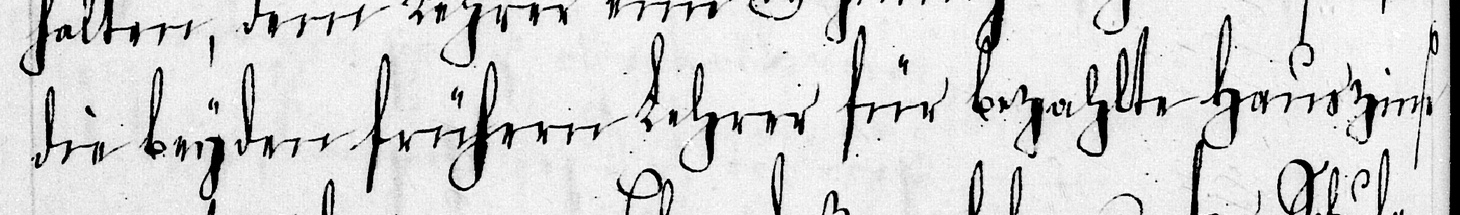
die beyden frühern Lehrer für bezahlte Hauszim¬
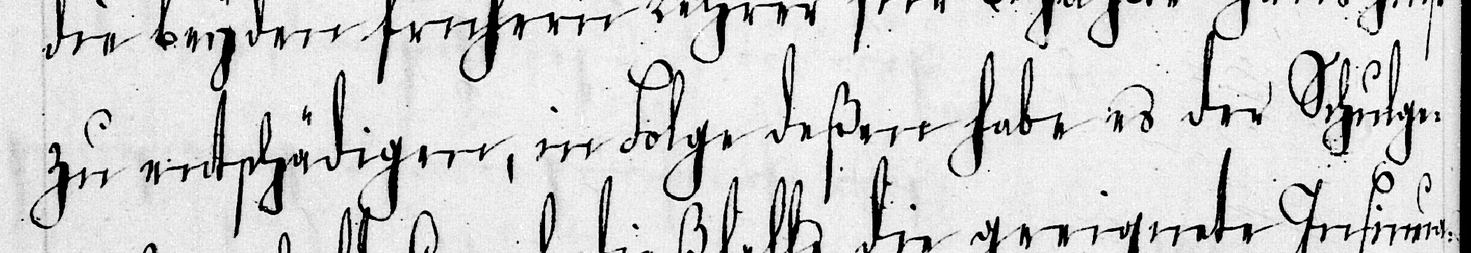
zu entschädigen, in Folge deßen habe es der Schulge¬
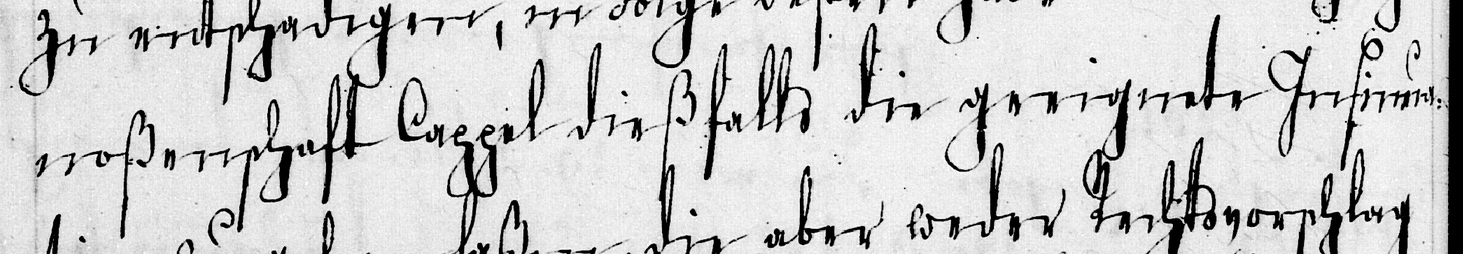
noßenschaft Cappel dießfalls die geeignete Insinu¬
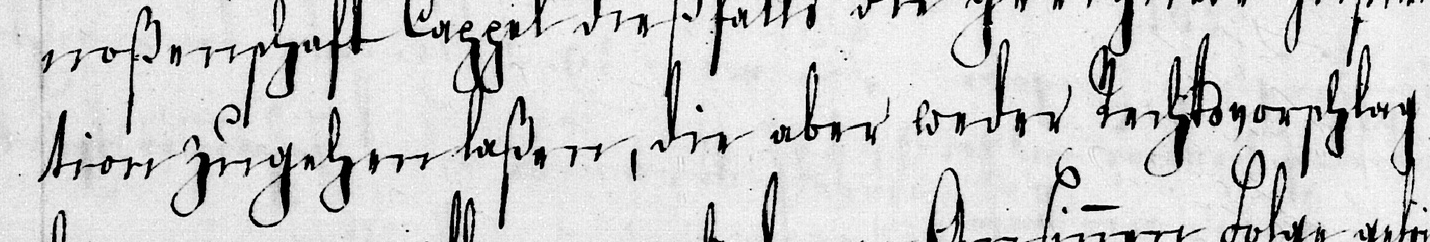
ation zugehen laßen, die aber weder Rechtsvorschlag
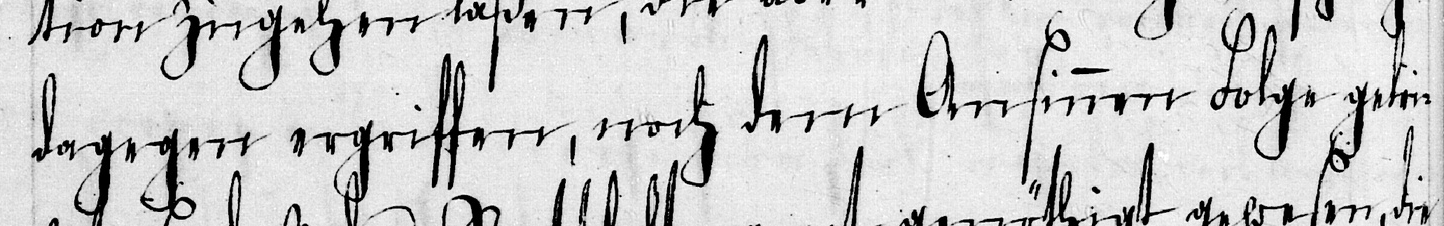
dagegen ergriffen, noch dem Ansinnen Folge gel¬
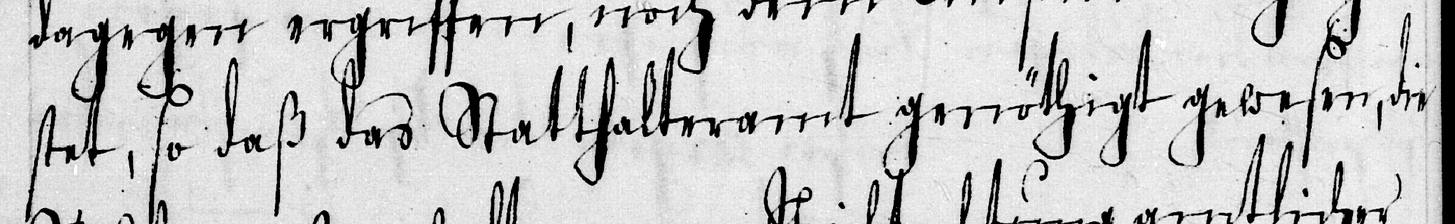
stet, so daß das Statthalteramt genöthigt gewesen, die
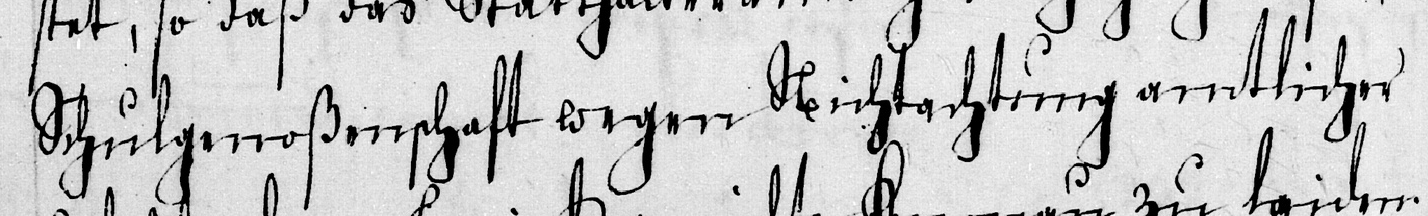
Schulgenoßenschaft wegen Nichtachtung amtlicher
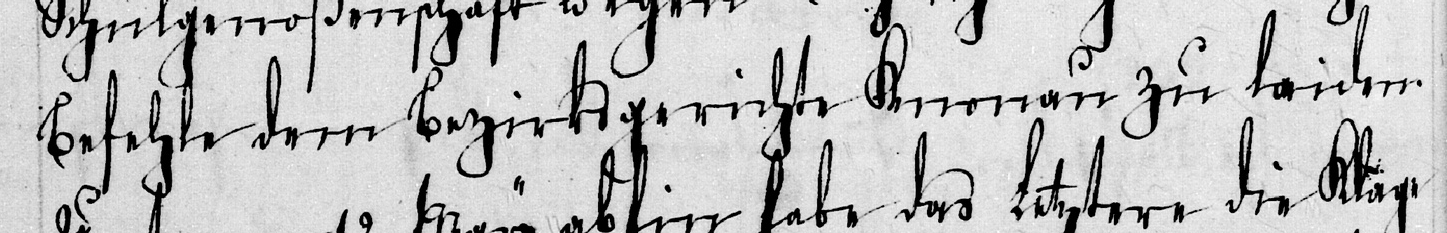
Befehle dem Bezirksgerichte Knonau zu laiden.
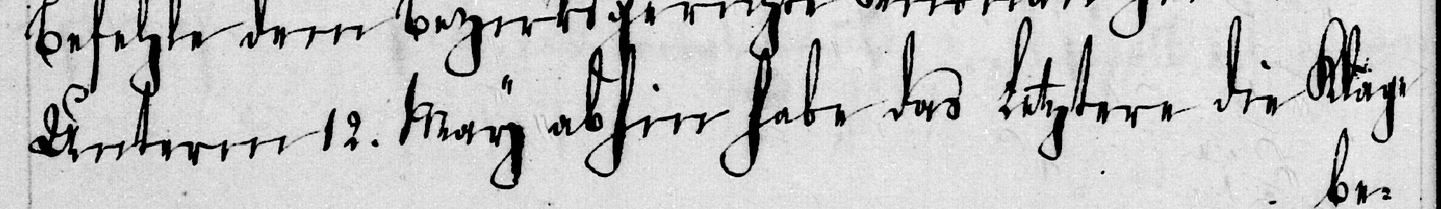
Unterm 12. May abhin habe das Letztere die Klage
